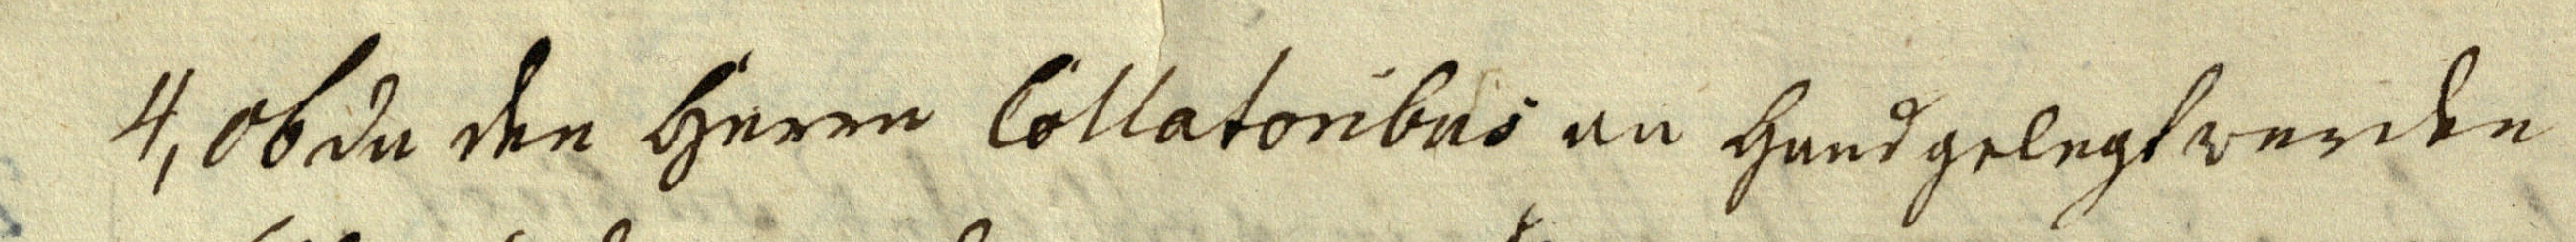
4, ob da den Herrn Collatoribus an Hnad gelegt werden
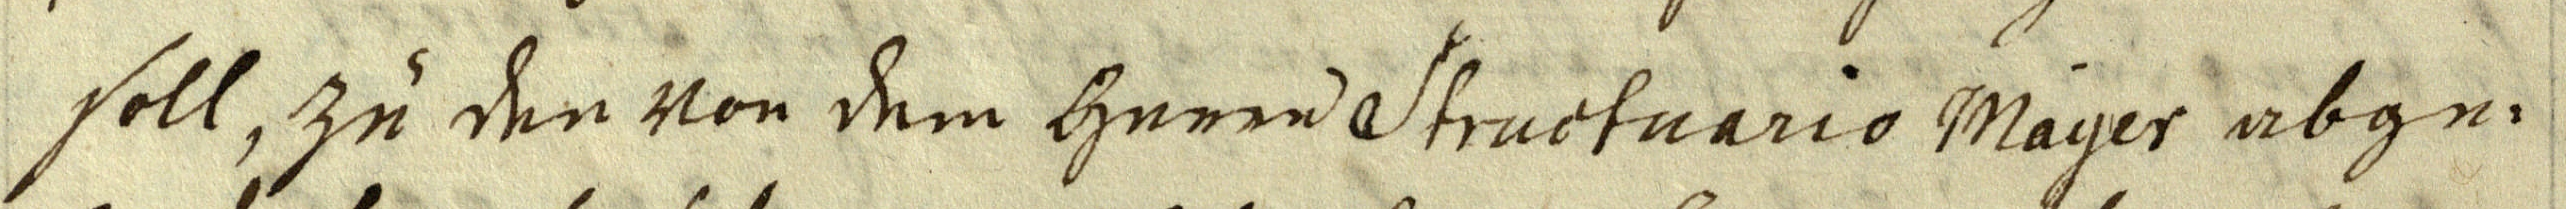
soll, zu den von dem Herrn Structuario Maÿer abge¬
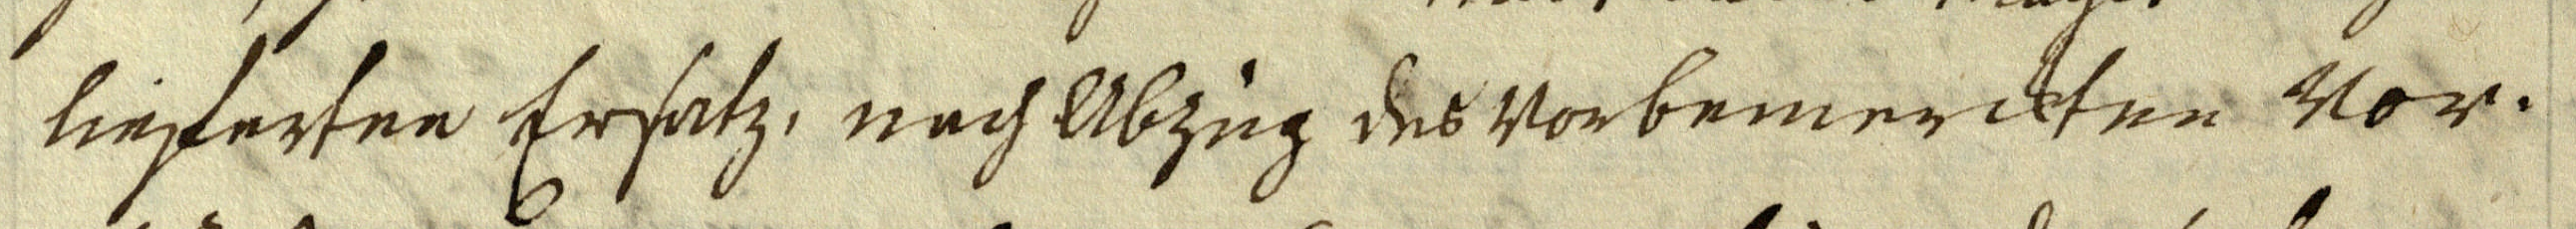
lieferten Ersatz, nach Abzug des vorbemerckten Vor¬
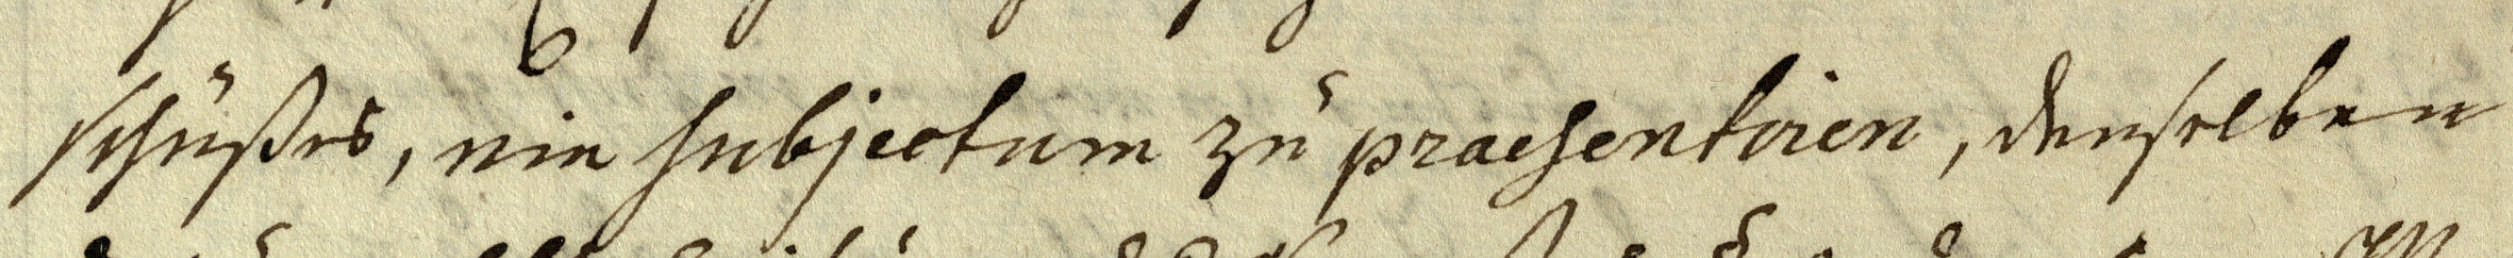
schußes, ein subjectum zu praesentiren, denselben
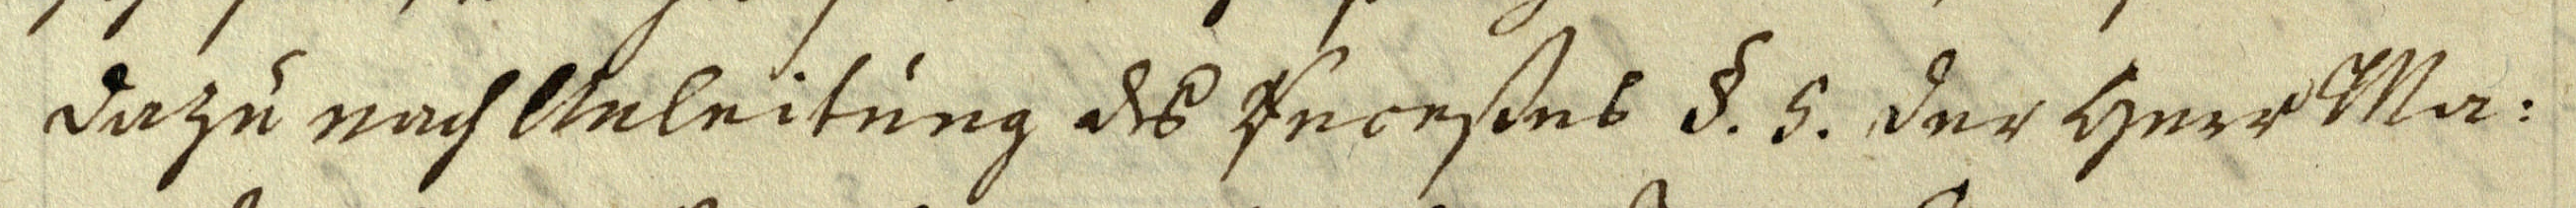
dazu nach Anleitung des Receßes §. 5. der Herr Ma¬
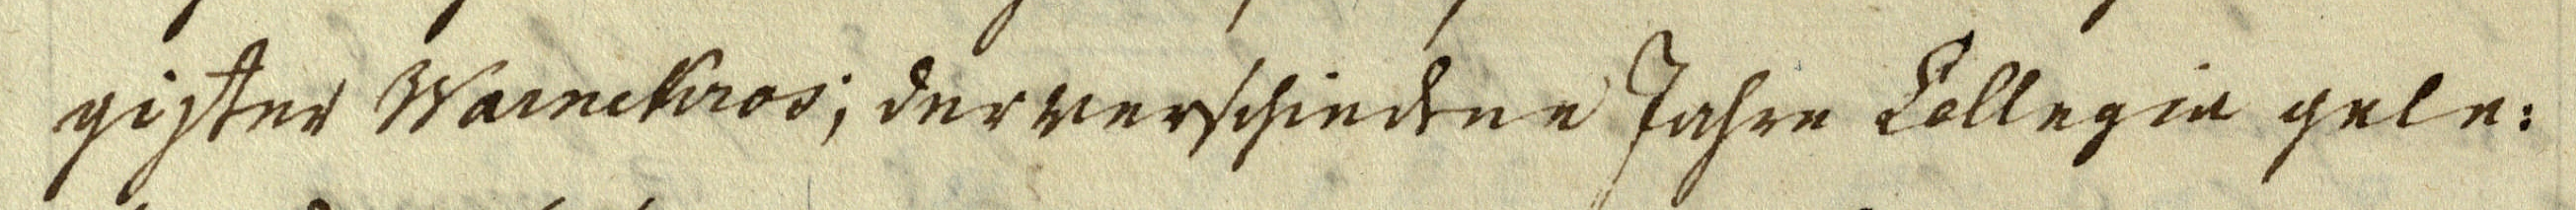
gister Warnekros; der verschiedene Jahre Collegia gele¬
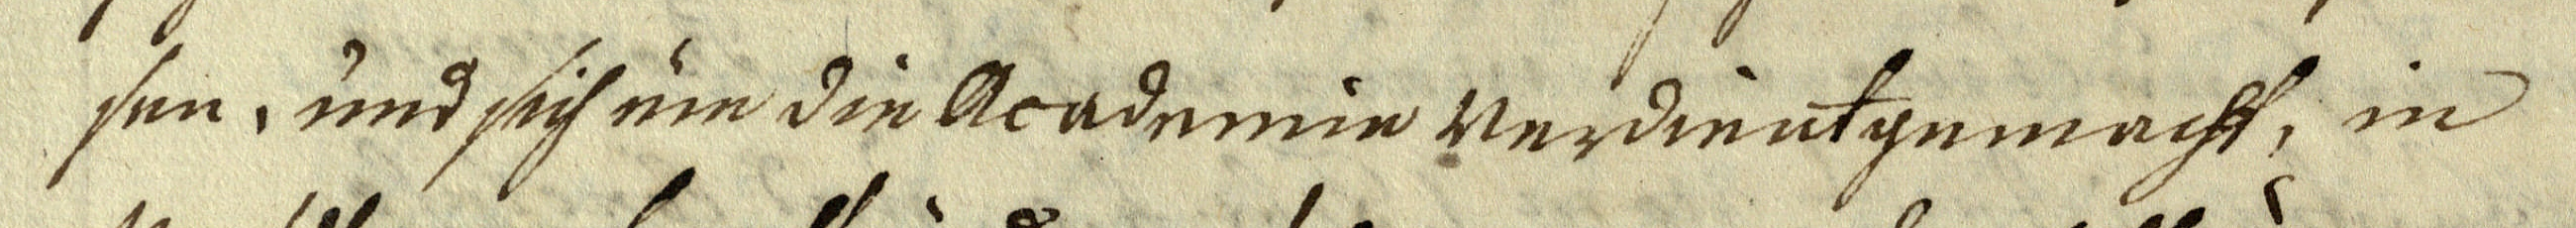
sen, und sich um die Academie verdientgemacht, in
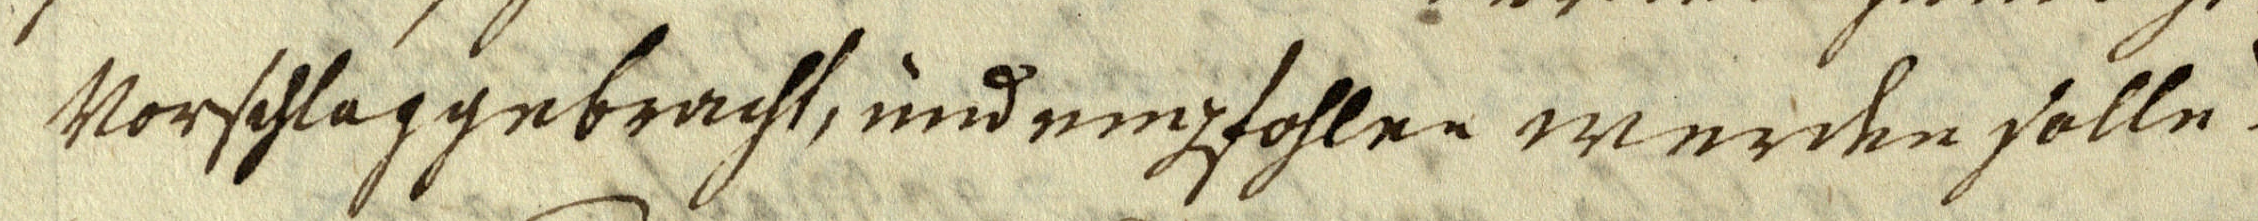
Vorschlag gebracht, und empfohlen werden solle!
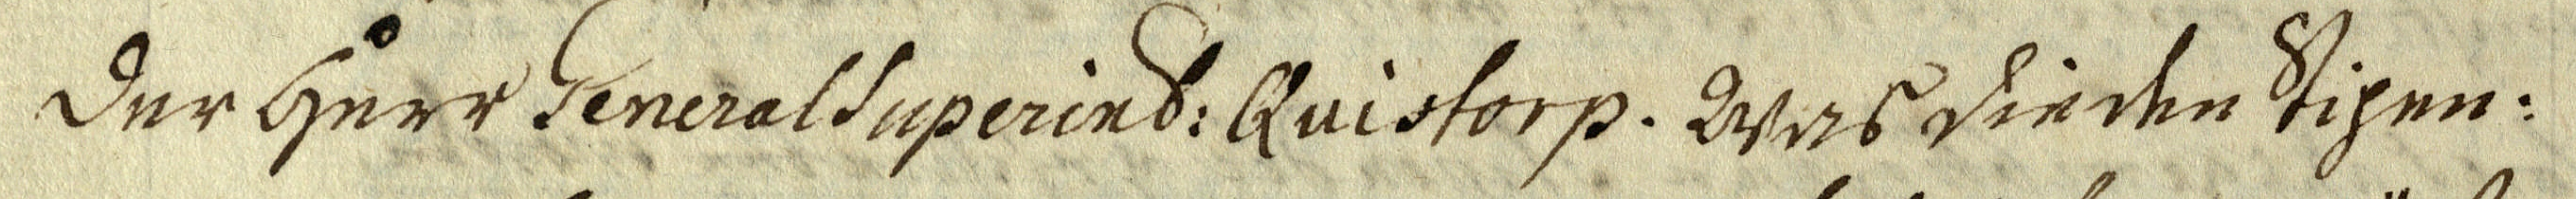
Der Herr GeneralSuperint. Quistorp. Was die den Stipen¬
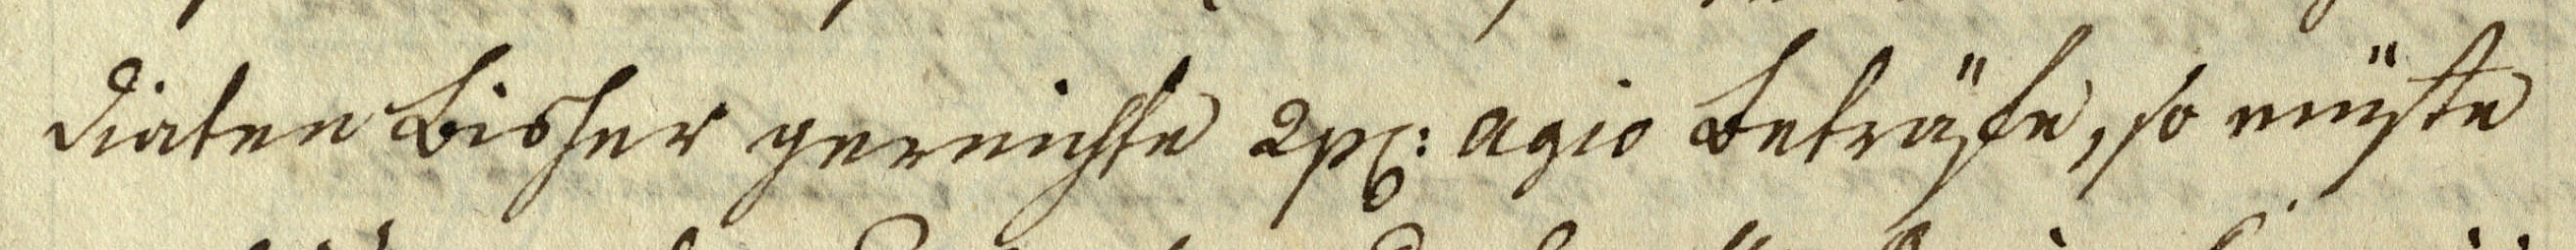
diaten bisher gereichte 2 p. agio beträfe, so müste
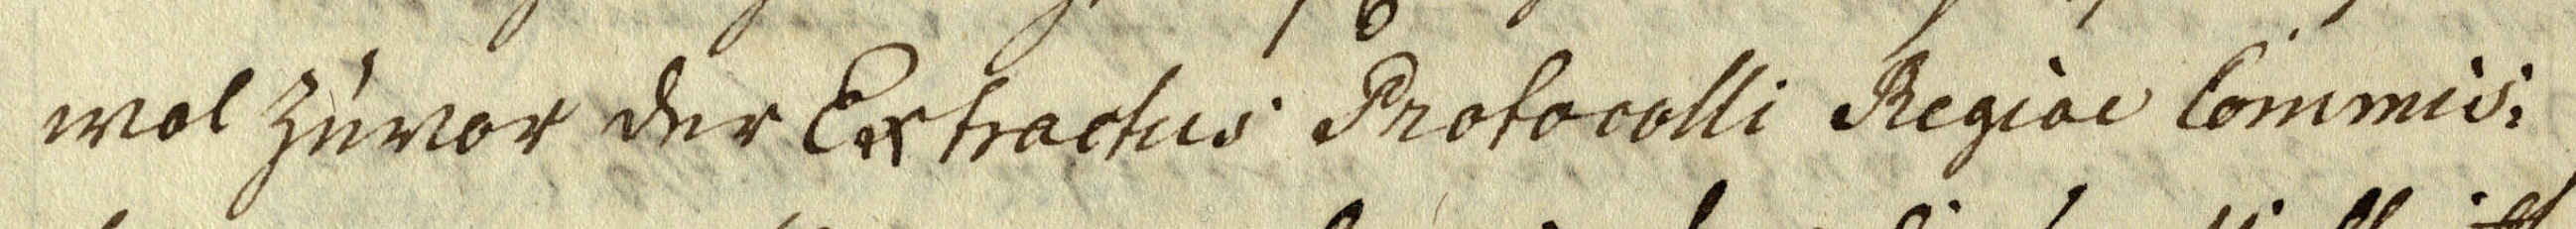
wol zuvor der Extractus Protocolli Regiae Commis¬
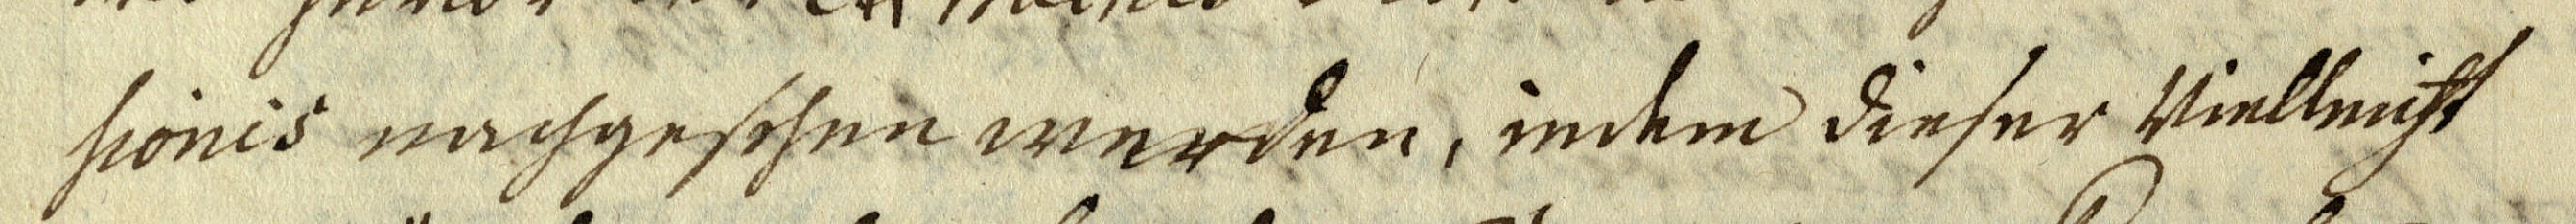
sionis nachgesehen werden, indem dieser vielleicht
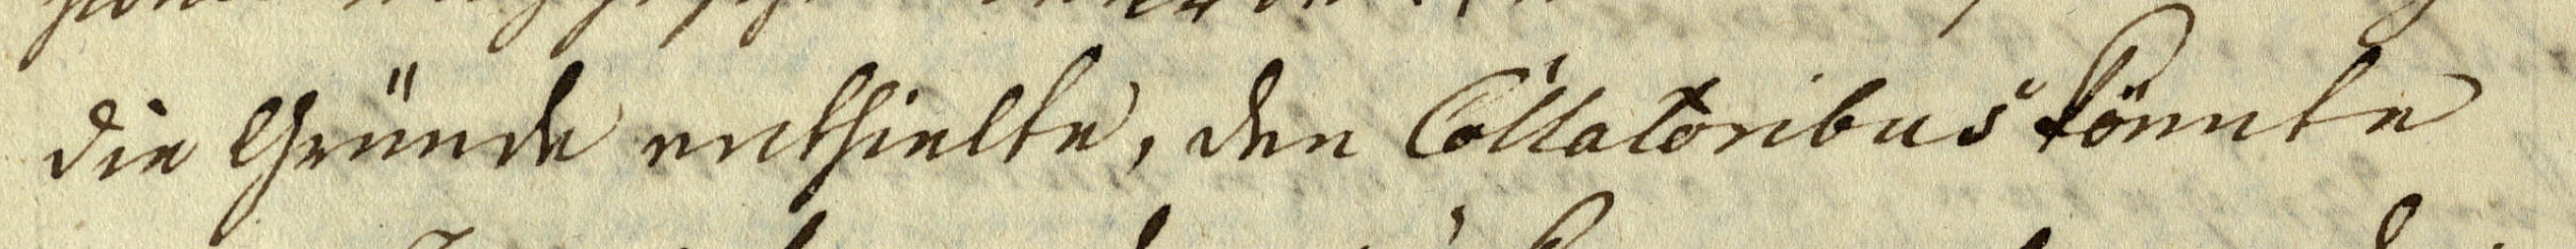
die Gründe enthielte, den Collatoribus könnte
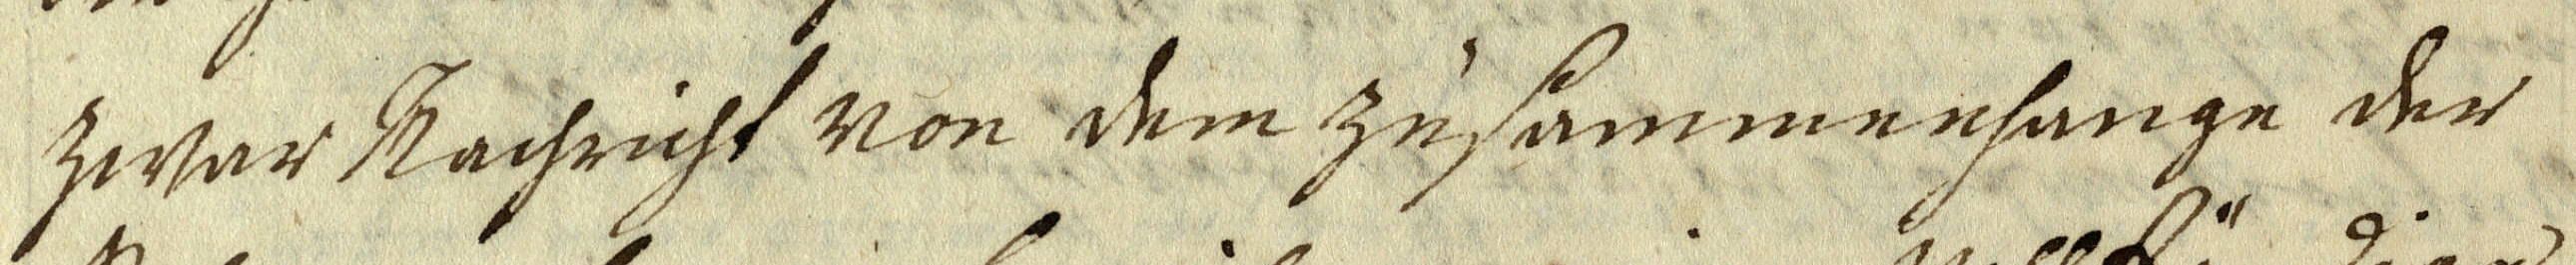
zwar Nachricht von dem Zusammenhange der
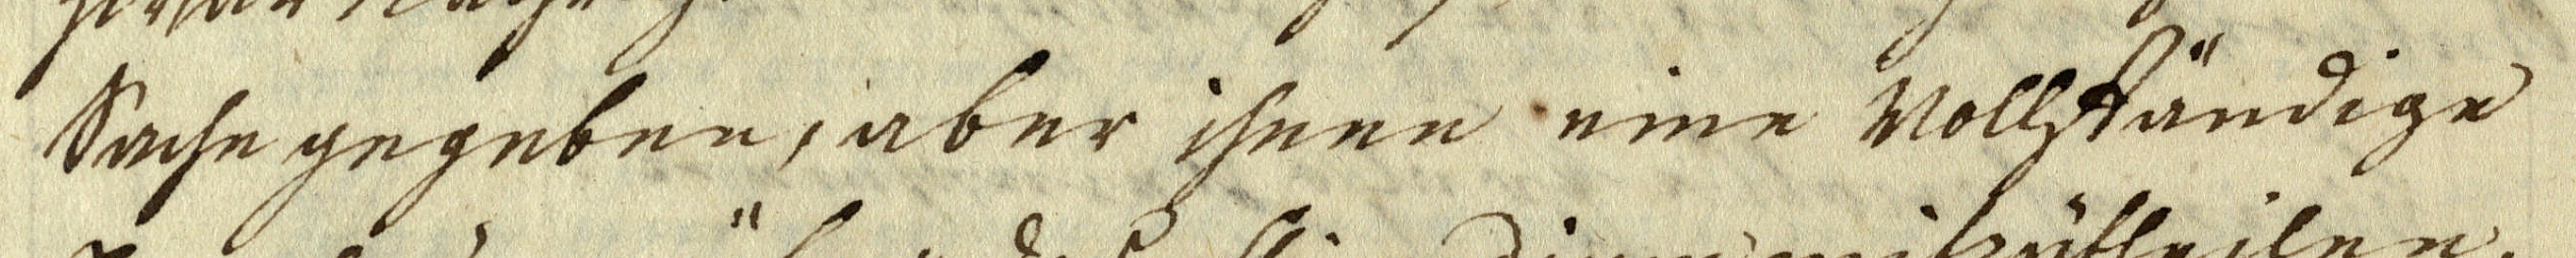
Sachegegeben, aber ihnen eine vollständige
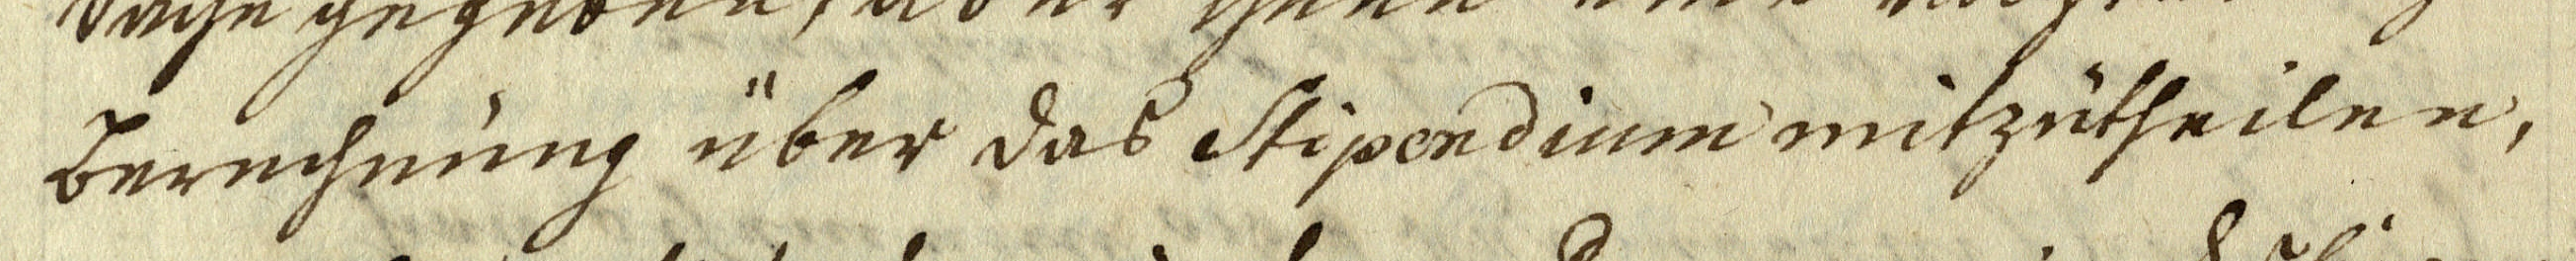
Berechnung über das Stipendium mitzutheilen,
